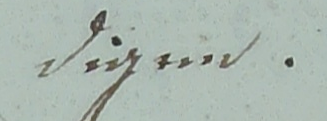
digen.
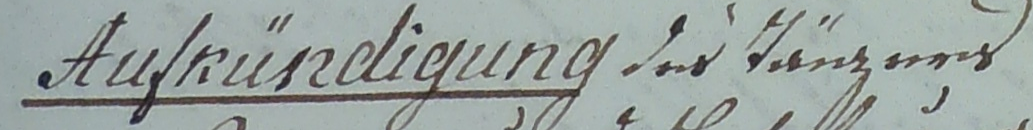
Aufkündigung des Tänzers
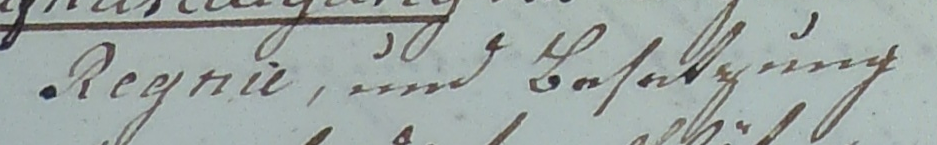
Regnie, und Besetzung
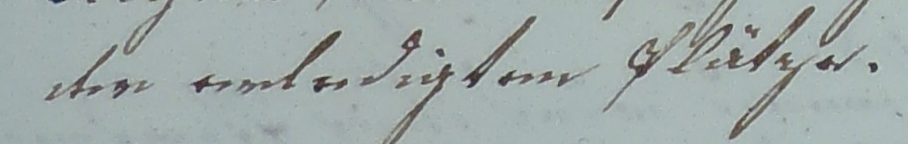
der erledigten Plätze.
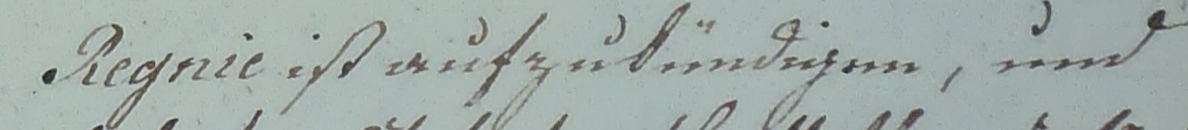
Regnie ist aufzukündigen, und
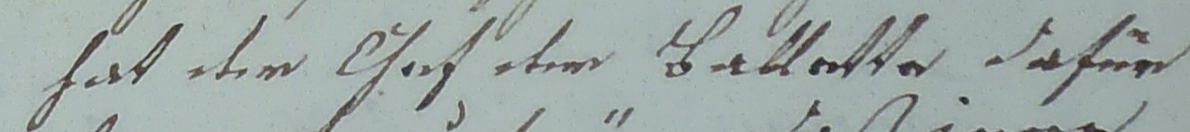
hat der Chef der Balette dafür
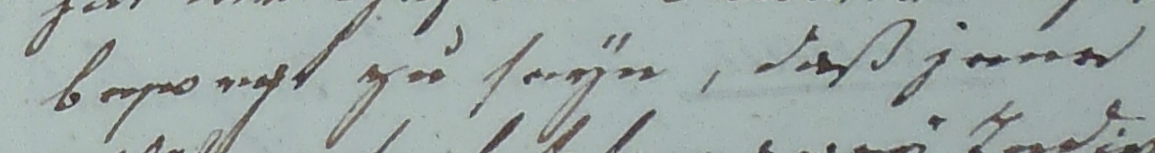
besorgt zu seyn, daß jene
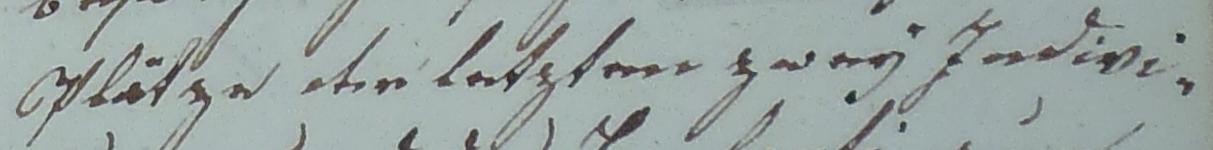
Plätze der letzten zwey Indivi¬
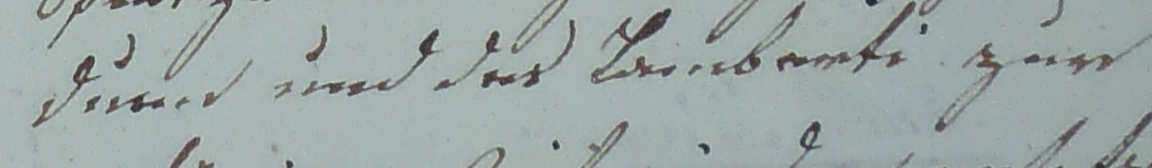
duen und des Lamberti zur
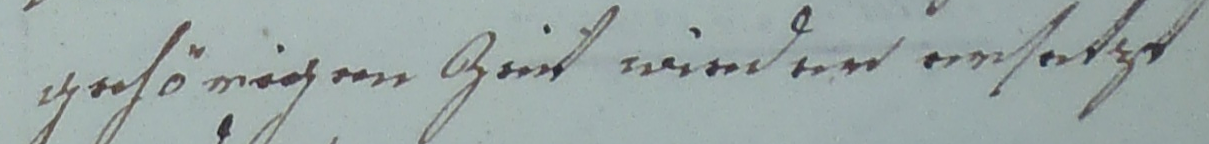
gehörigen Zeit wieder ersetzt
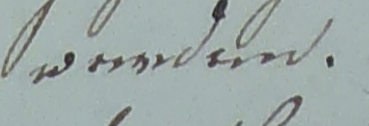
werden.
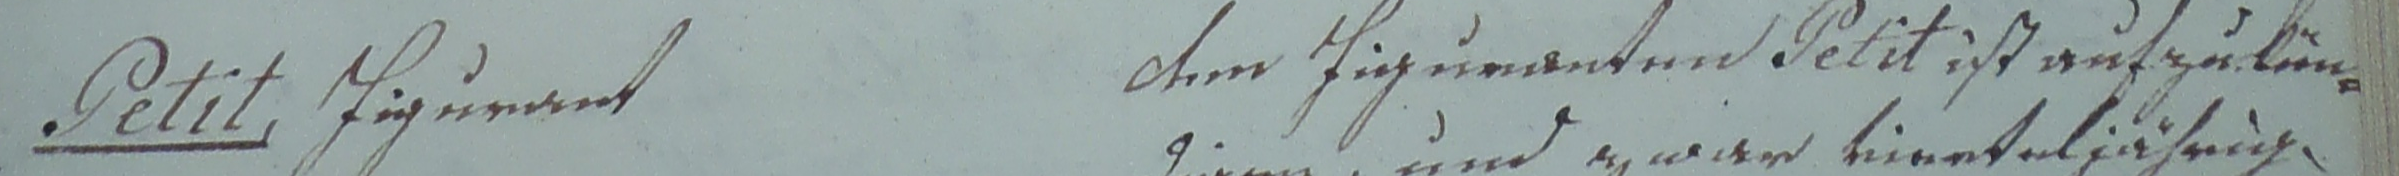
Petit, Figurant Dem Figuranten Petit ist aufzukün¬
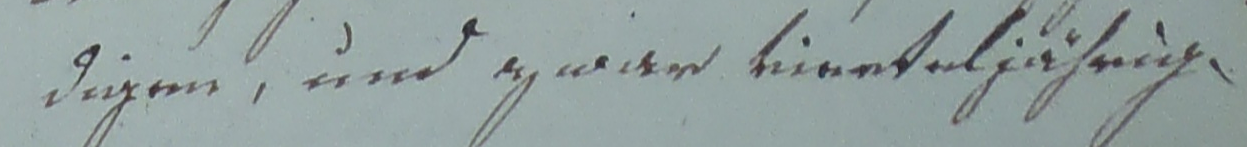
digen, und zwar vierteljährig.
